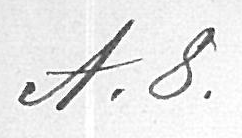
A. 8.
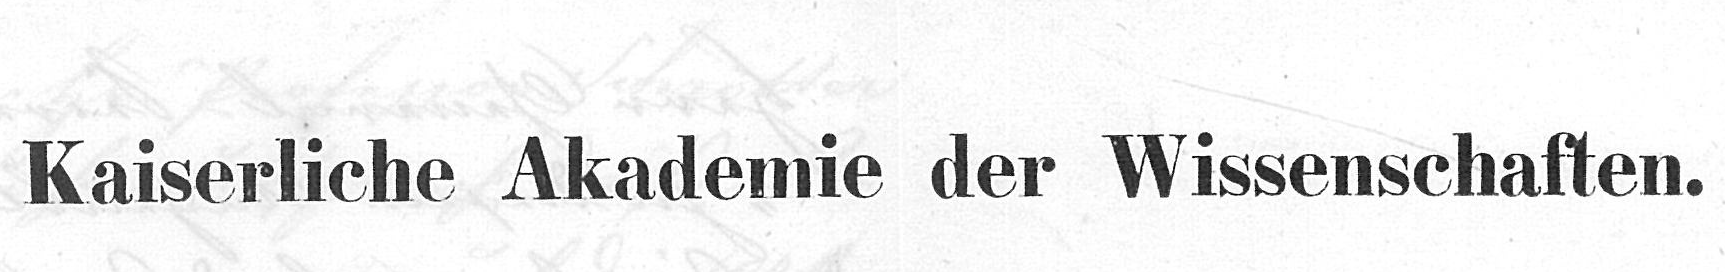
Kaiserliche Akademie der Wissenschaften.
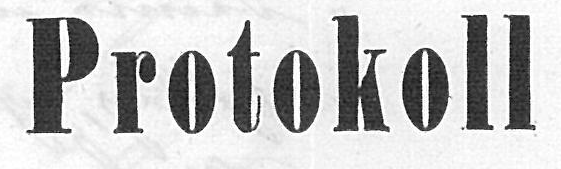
Protokoll
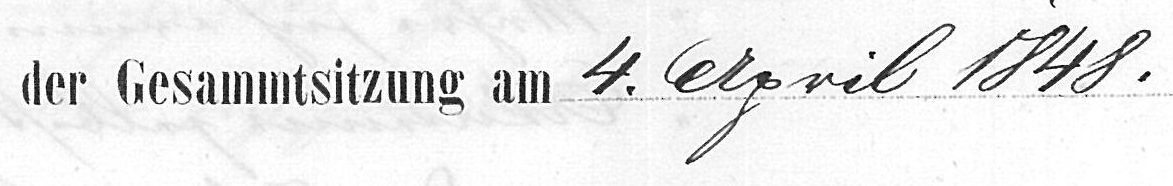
der Gesammtsitzung am 4. April 1848.
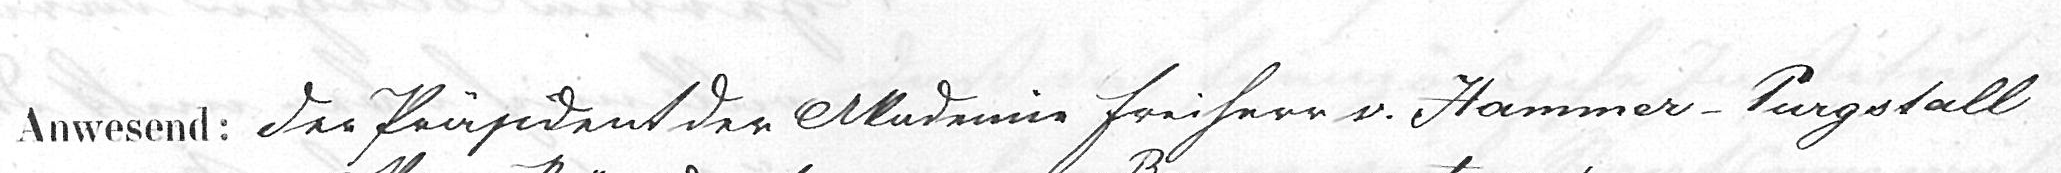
Anwesend: Der Präsident der Akademie Freiherr v. Hammer-Purgstall
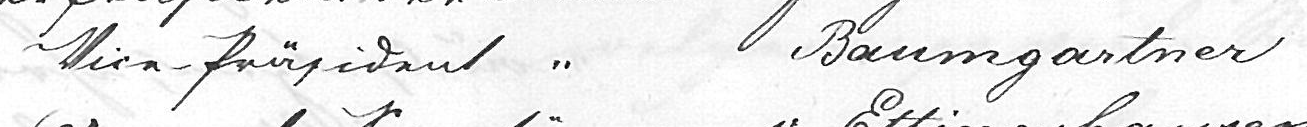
" Vice-Präsident " Baumgartner
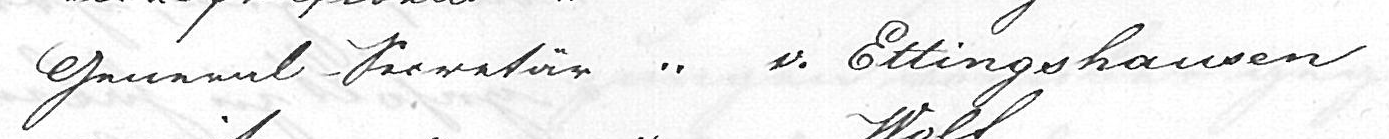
" General-Secretär " v. Ettingshausen
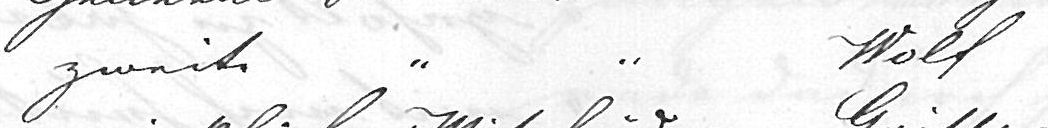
" zweite " Wolf
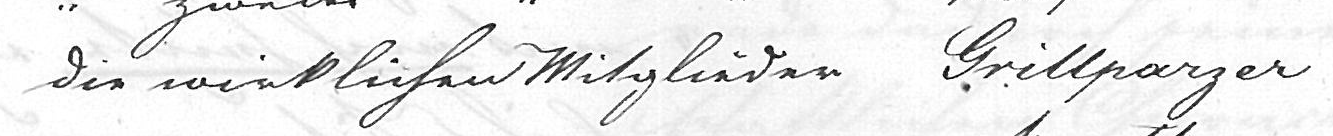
die wirklichen Mitglieder Grillparzer
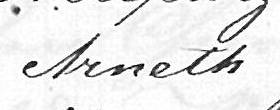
Arneth
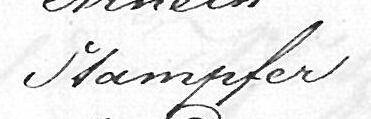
Stampfer
